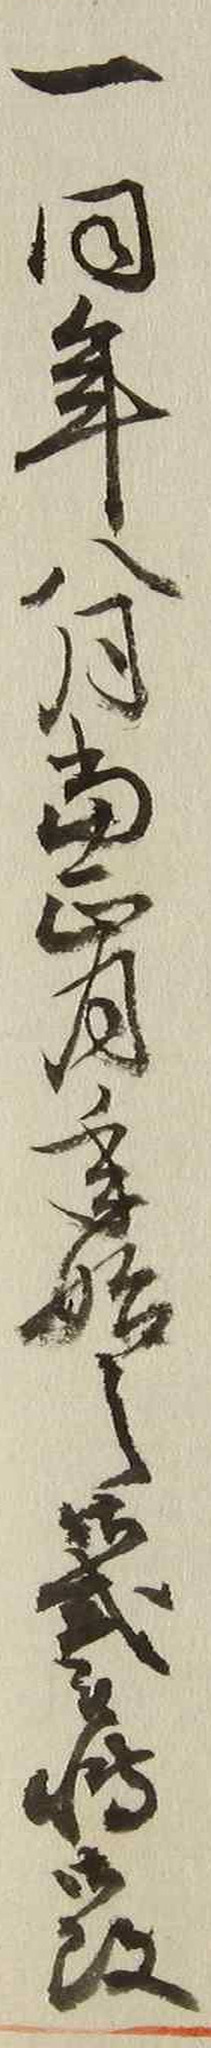一同年八月当正月年始之御式被御改
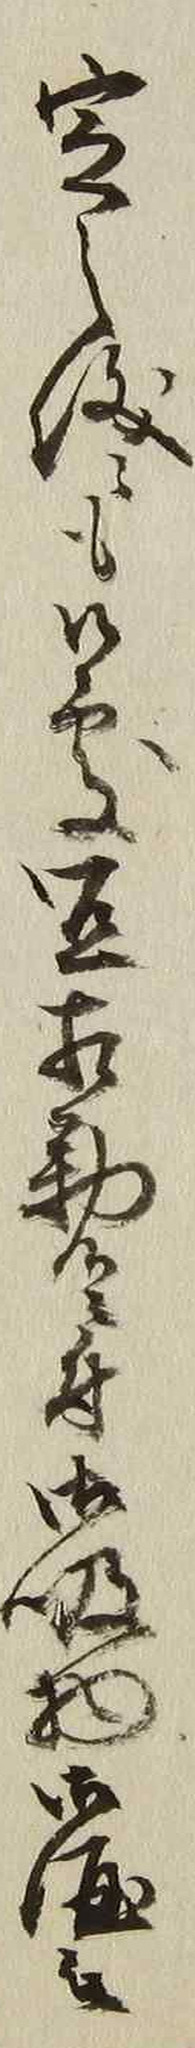定之儀ニも候処宜相勤候ニ付御吸物御酒被
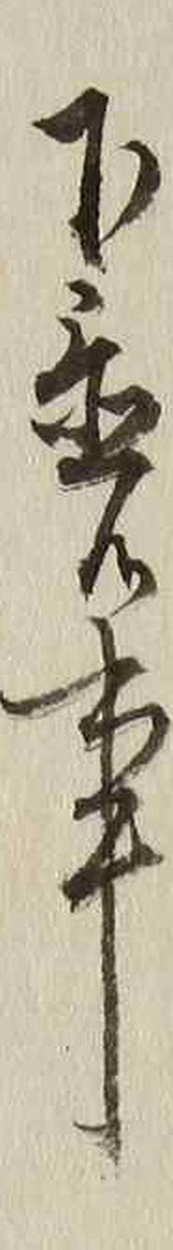下置候事
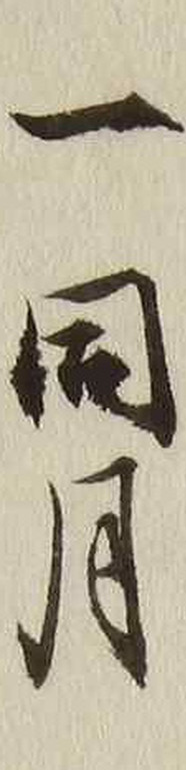一同月
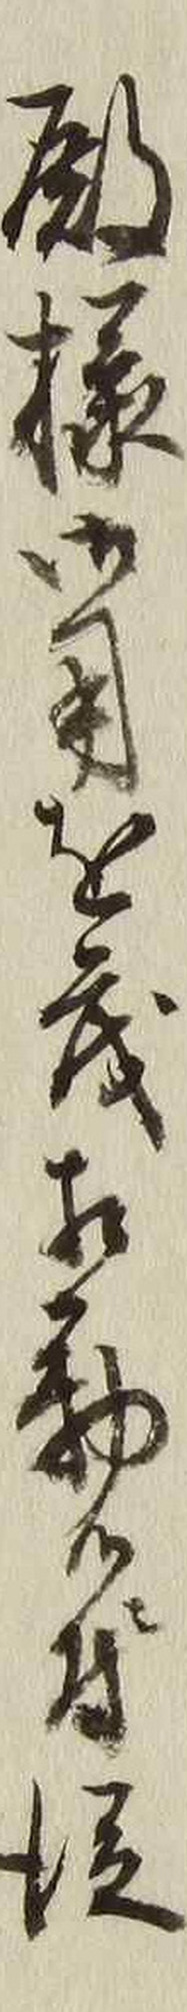殿様御用を茂相勤候ニ付従
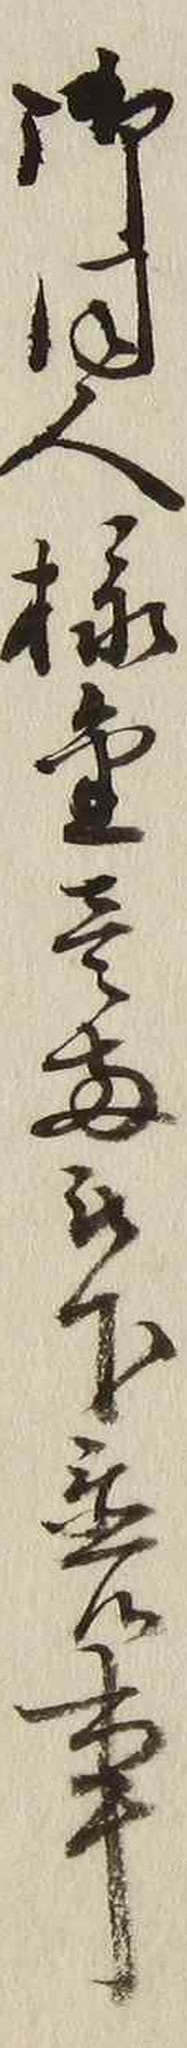御同人様金壱両被下置候事
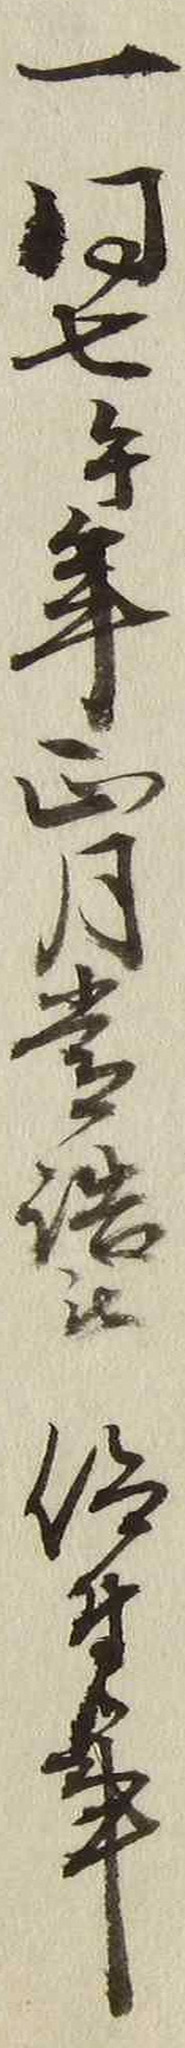一同七午年正月常詰被仰付候事
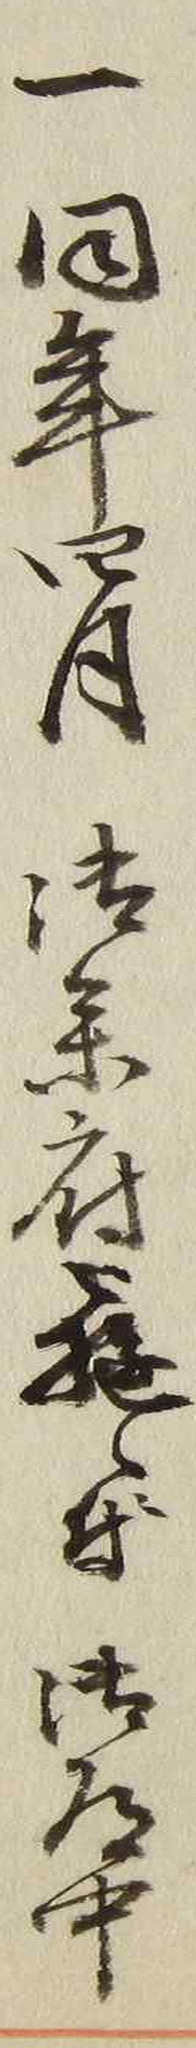一同年四月御参府被遊候ニ付御道中
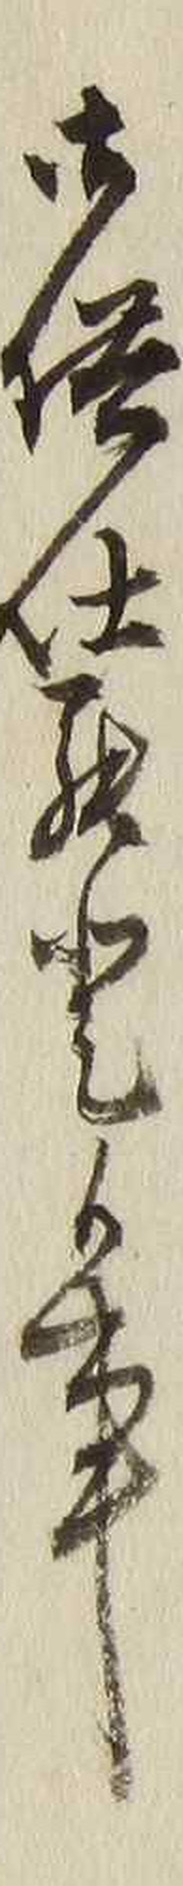御供仕罷登候事
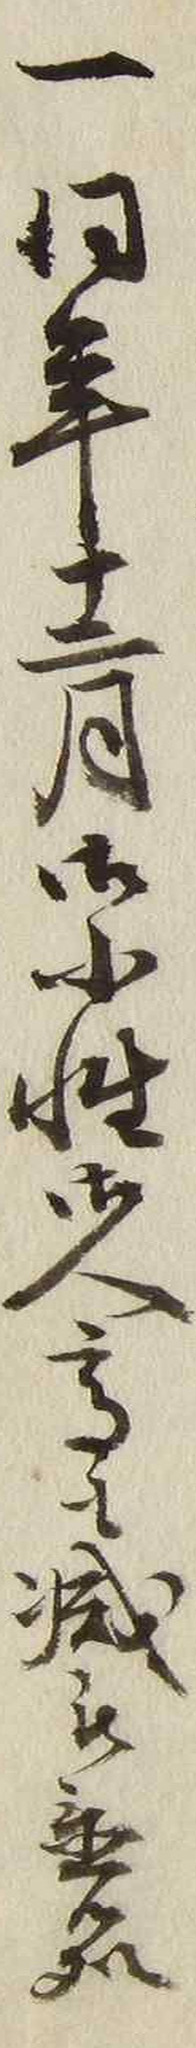一同年十二月御小性御人高も減被置候処
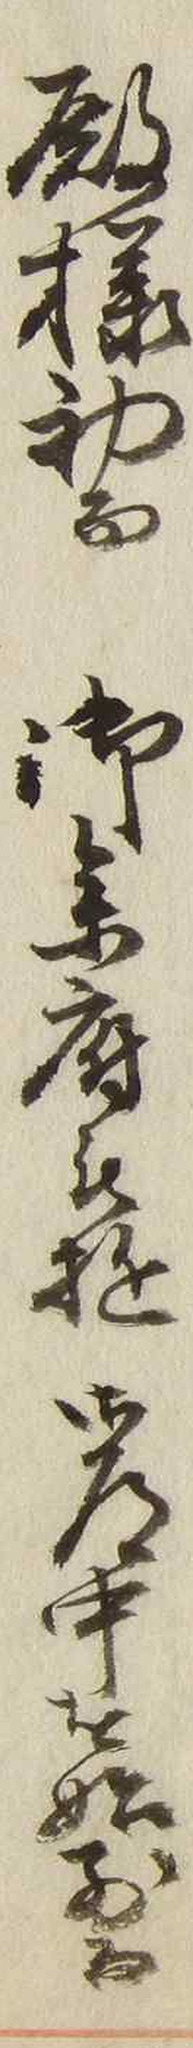殿様初而御参府被遊御道中を始別而

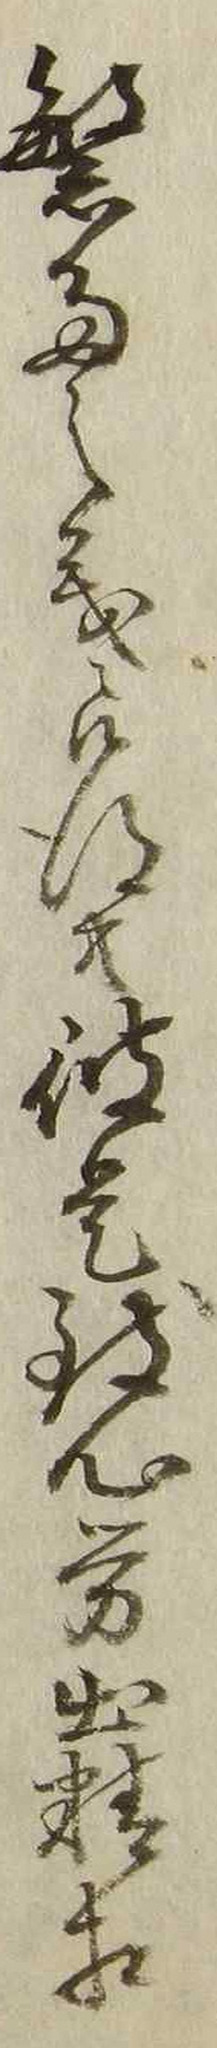繁多之義ニ候得共彼是致心労出精相
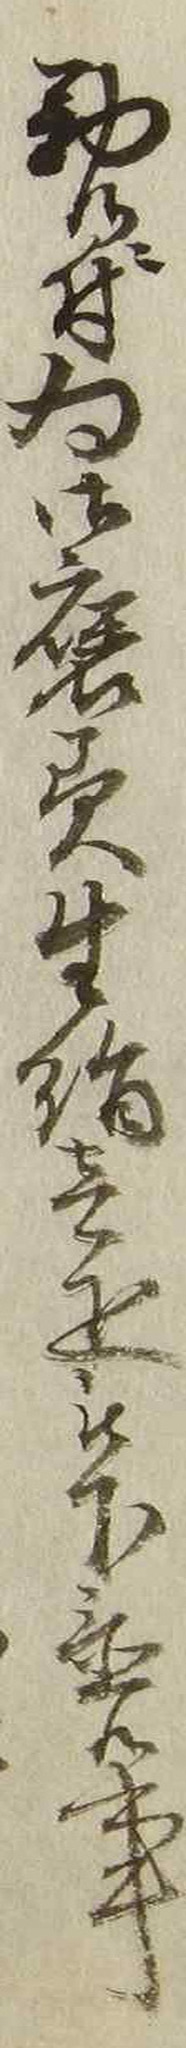勤候ニ付為褒美生絹壱疋被下置候事
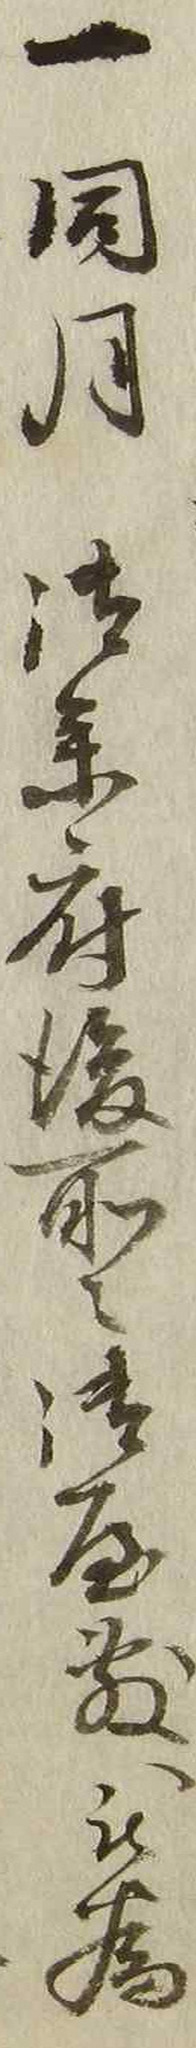一同月御参府後所々御屋敷へ被為
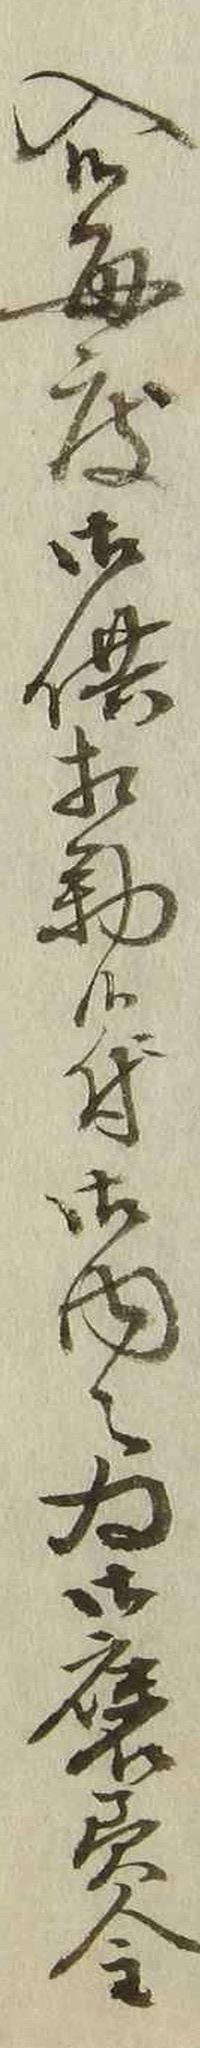入候毎度御供相勤候ニ付御内々為御褒美金
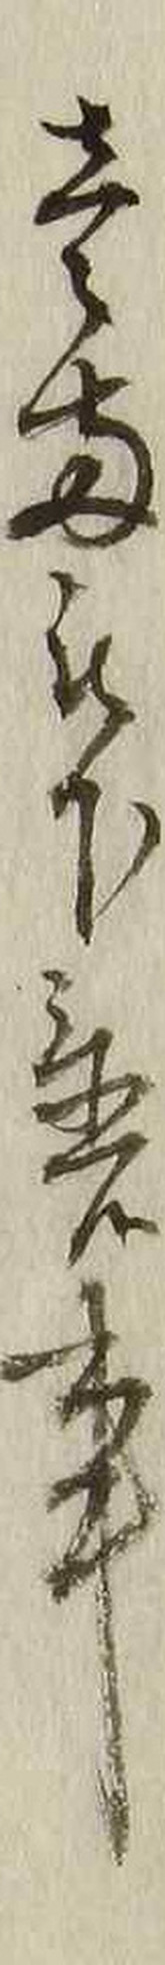壱両被下置候事
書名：諸士系譜　巻之23　い之部23
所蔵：会津若松市立会津図書館
